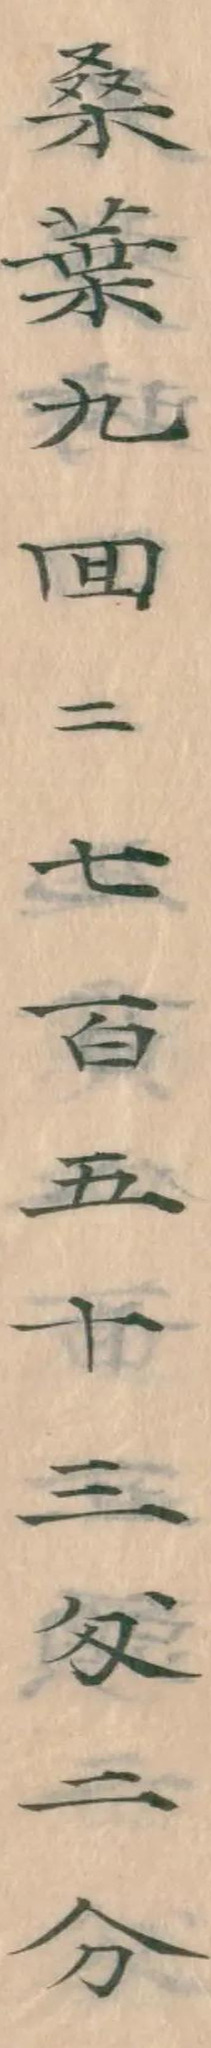桑葉九回ニ七百五十三匁二分
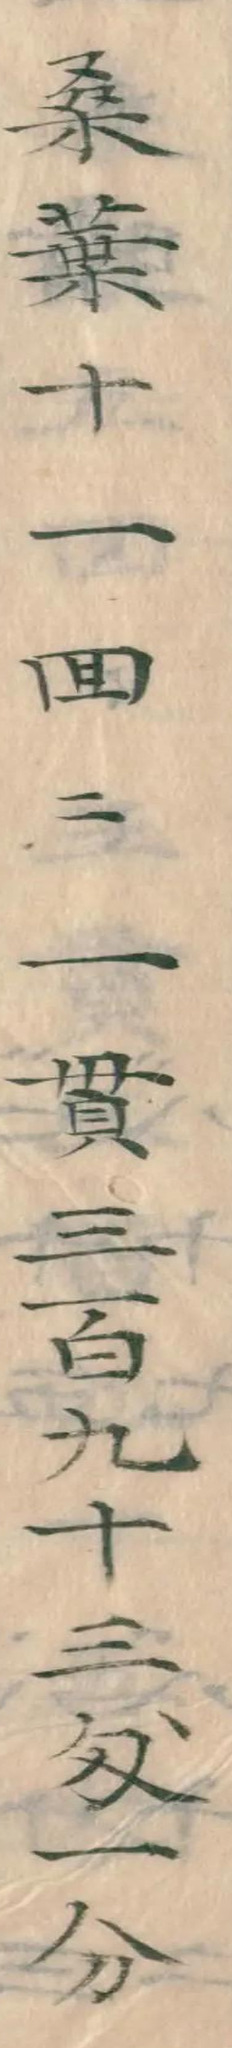桑葉十一回ニ一貫三百九十三匁一分
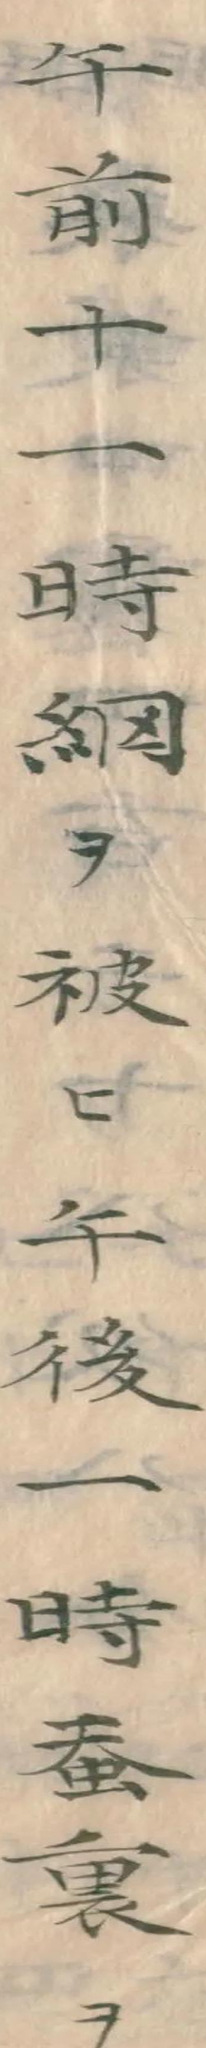午前十一時網ヲ被ヒ午後一時蚕裏ヲ
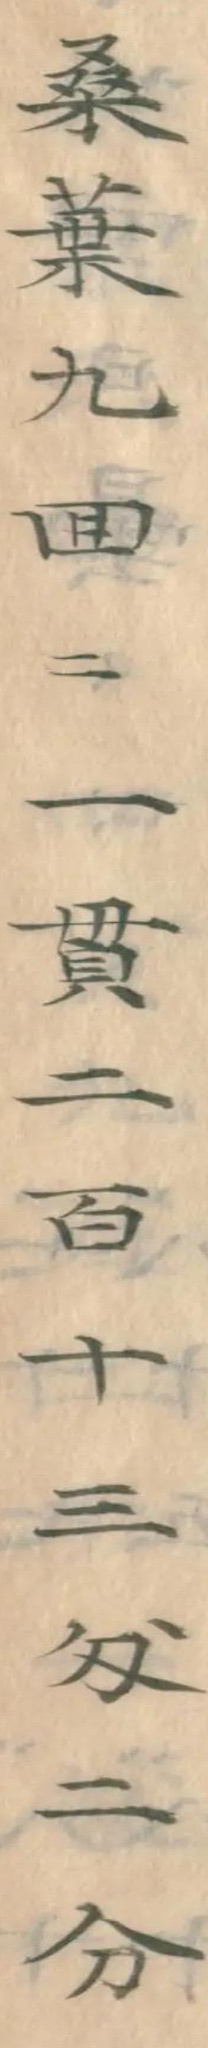桑葉九回ニ一貫二百十三匁二分

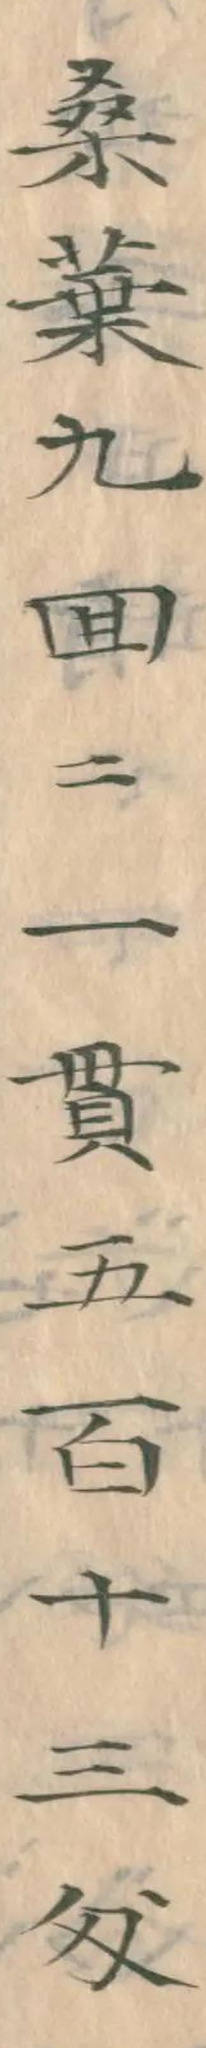桑葉九回ニ一貫五百十三匁
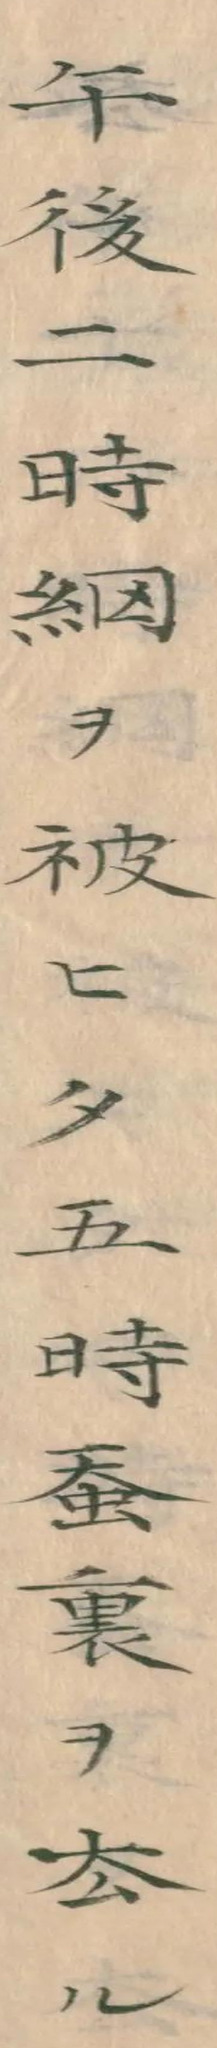午後二時網ヲ被ヒ夕五時蚕裏ヲ去ル
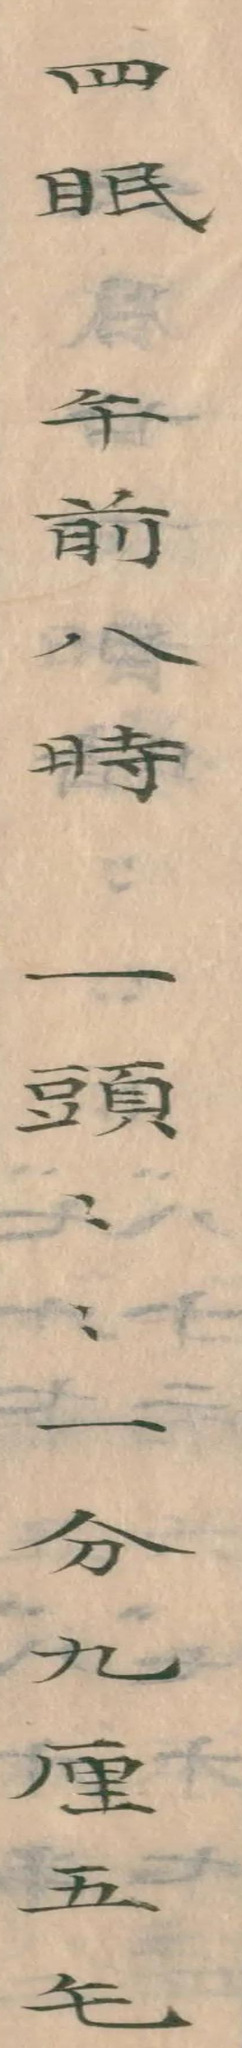四眠午前八時一頭々々一分九厘五毛
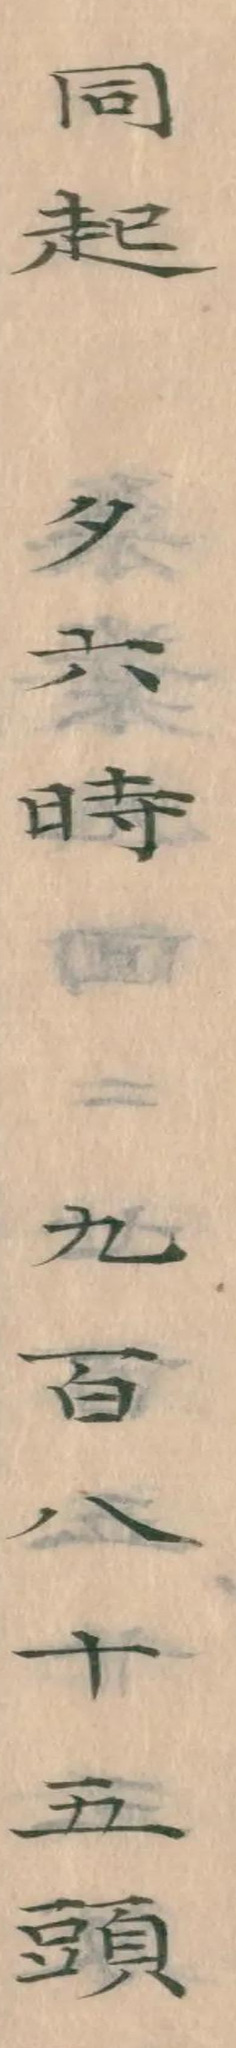同起夕六時九百八十五頭
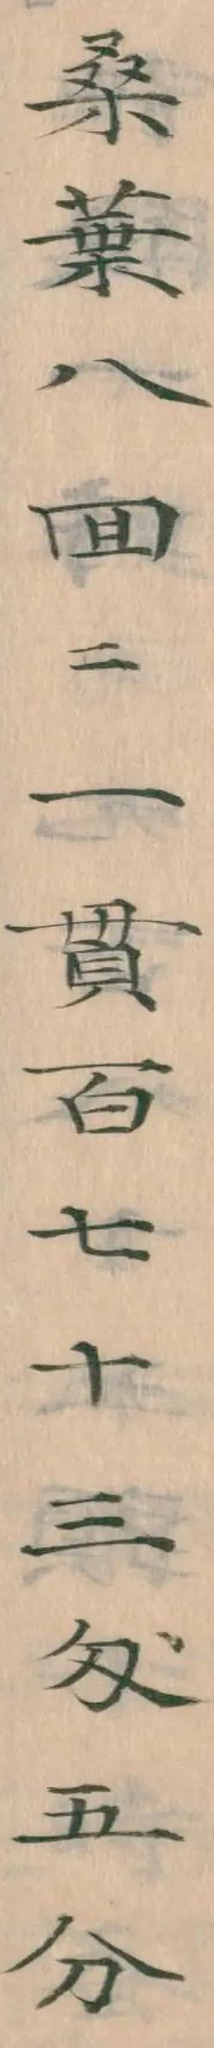桑葉八回ニ一貫百七十三匁五分
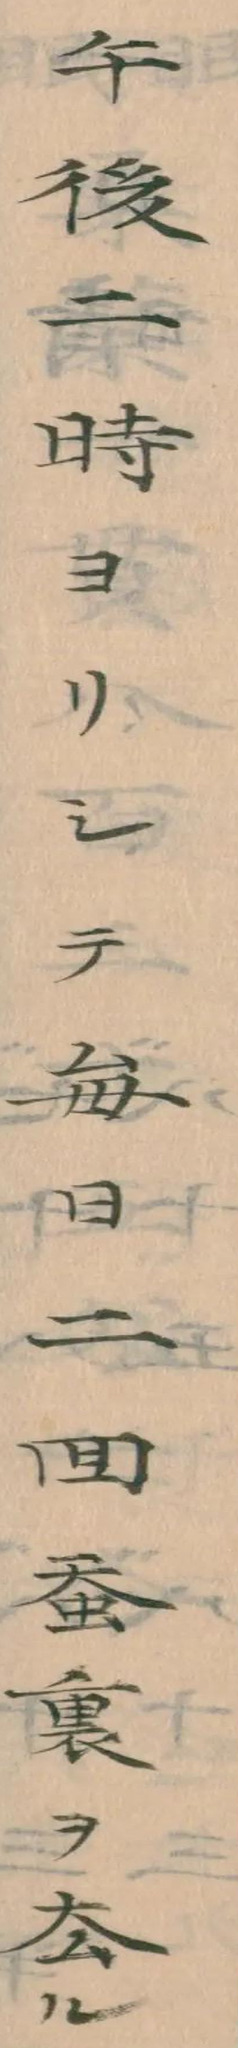午後二時ヨリシテ毎日二回蚕裏ヲ去ル
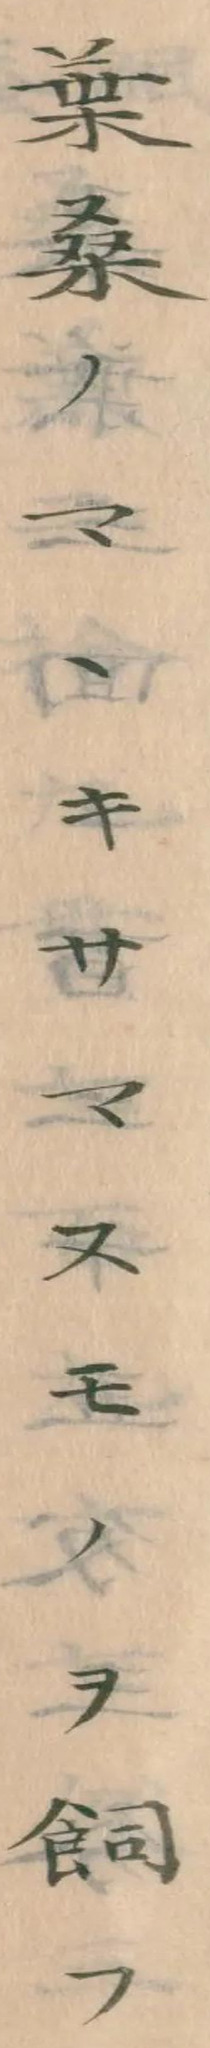桑葉のマヽキサマヌモノヲ飼フ
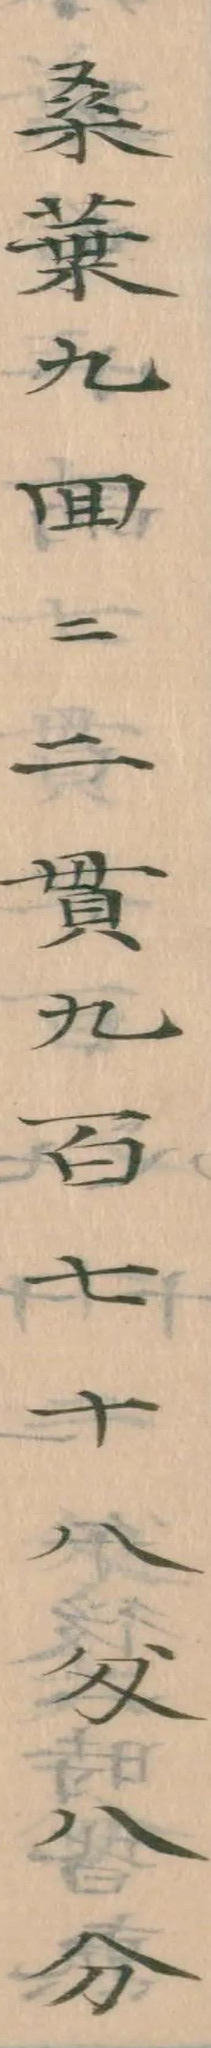桑葉九回ニ二貫九百七十八匁八分
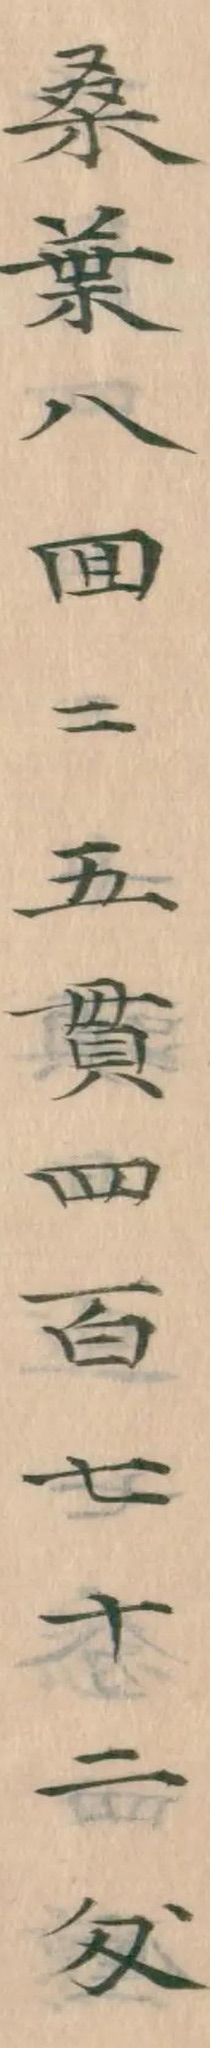桑葉八回ニ五貫四百七十二匁
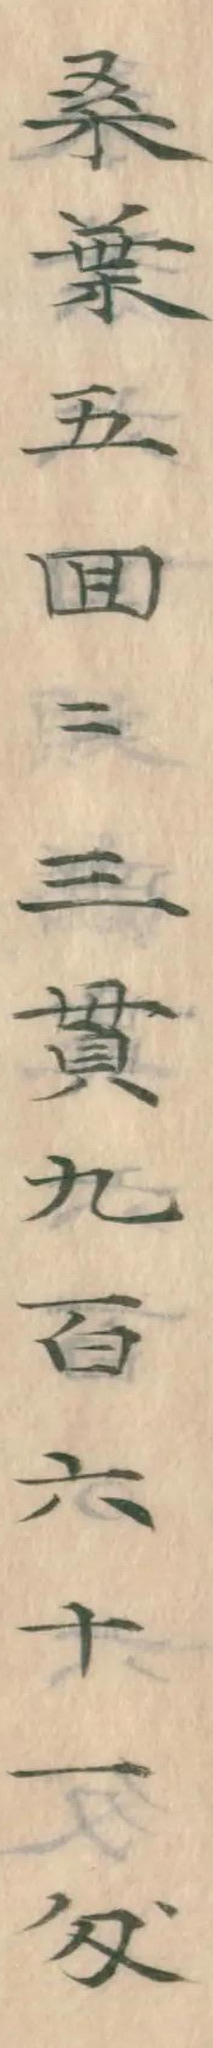桑葉五回ニ三貫九百六十一匁
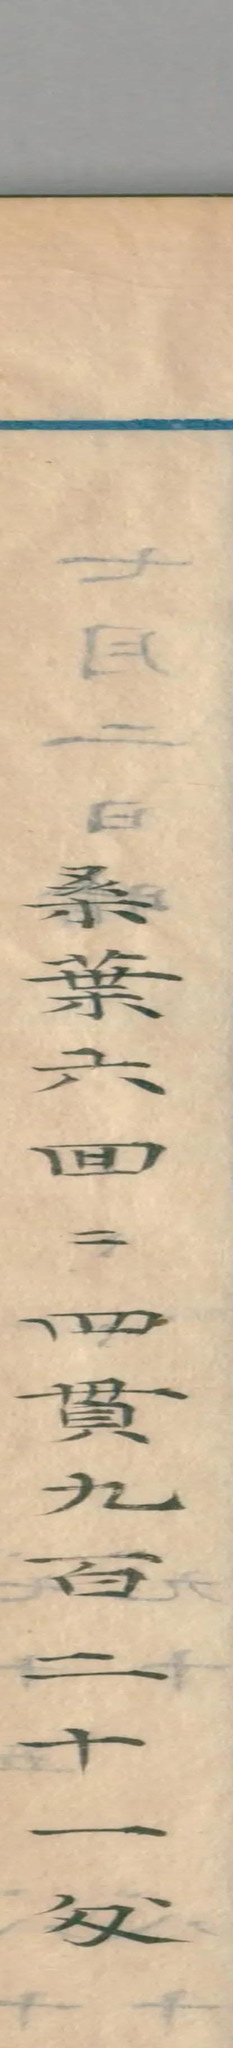桑葉六回ニ四貫九百二十一匁

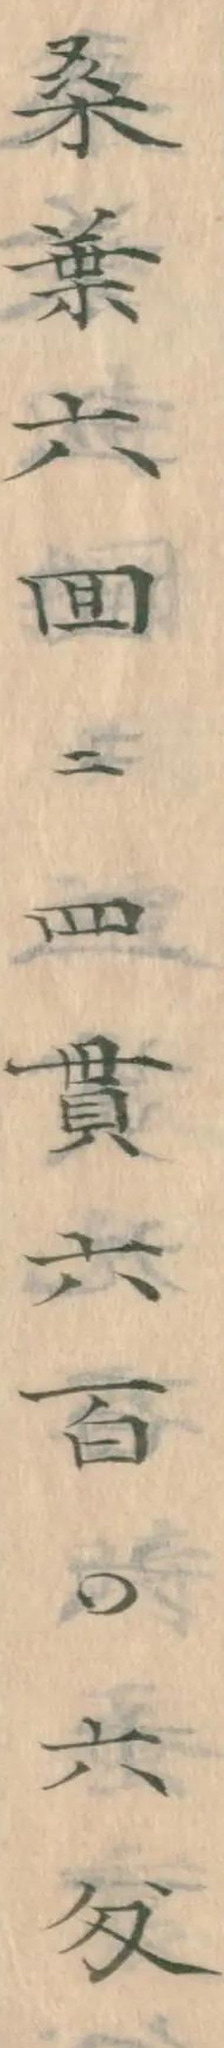桑葉六回ニ四貫六百〇六匁
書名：蚕桑集成
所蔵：国立国会図書館 National Diet Library, JAPAN
